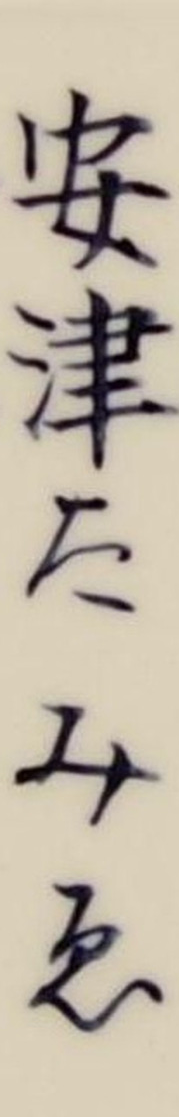安津たみゑ
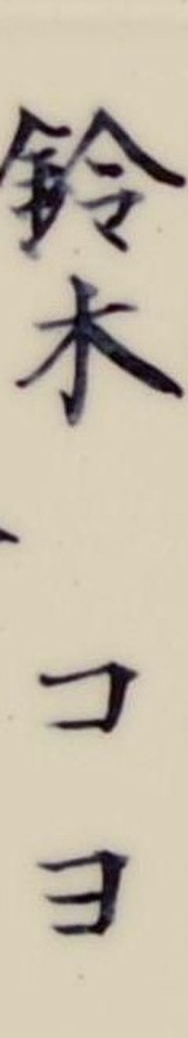鈴木コヨ
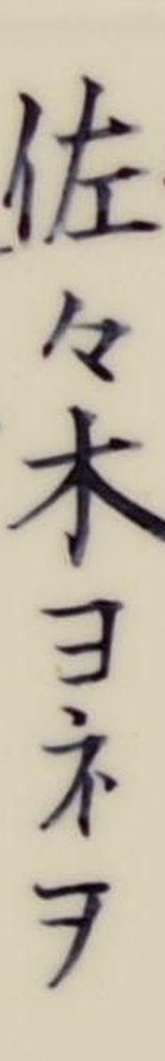佐々木ヨネヲ
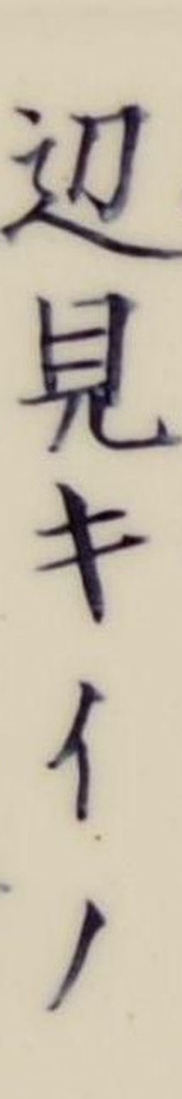辺見キイノ
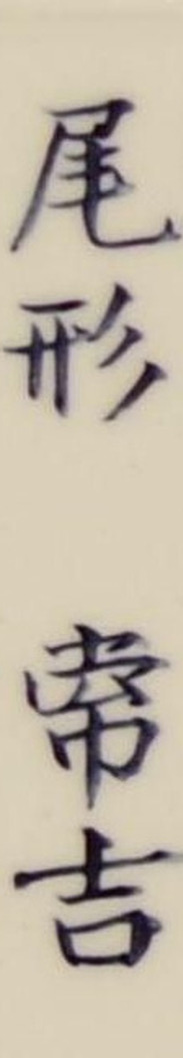尾形常吉
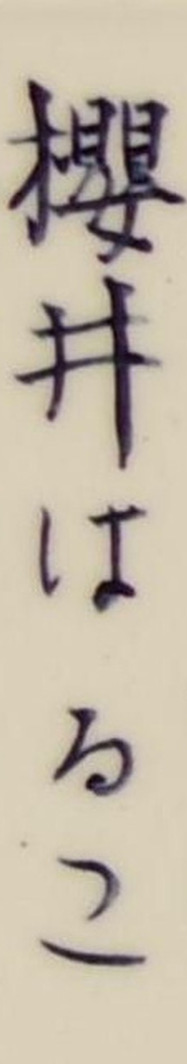桜井はるこ
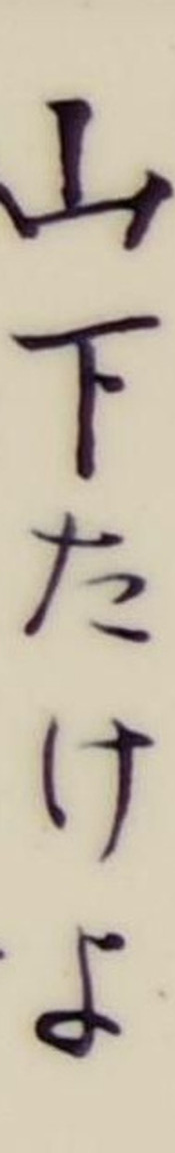山下たけよ
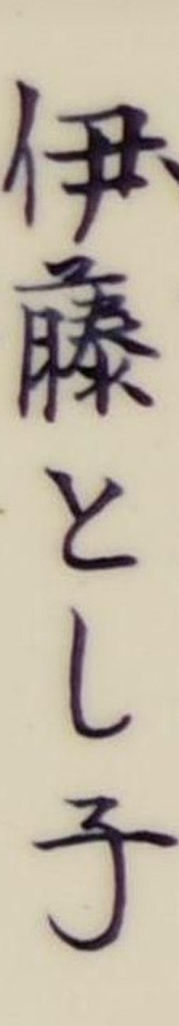伊藤とし子
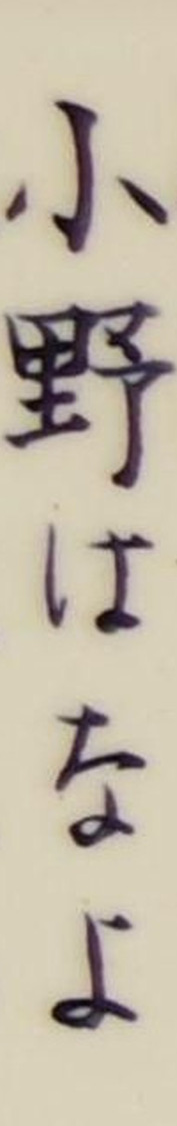小野はなよ
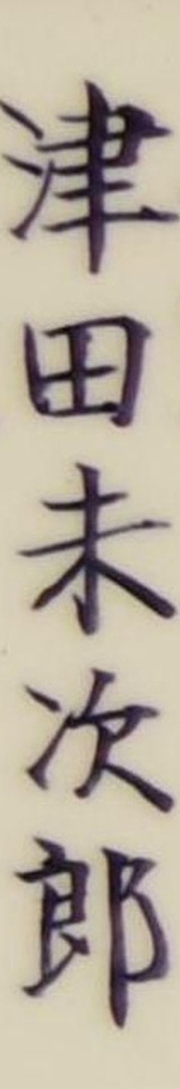津田未次郎
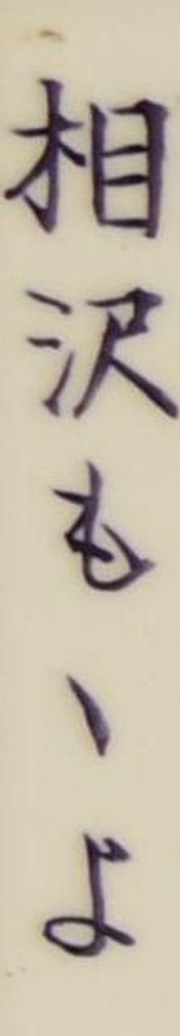相沢もゝよ

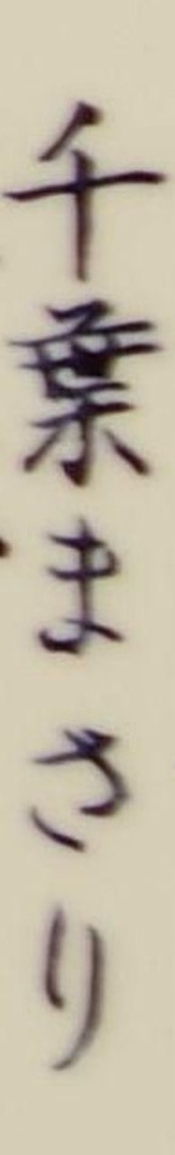千葉まさり
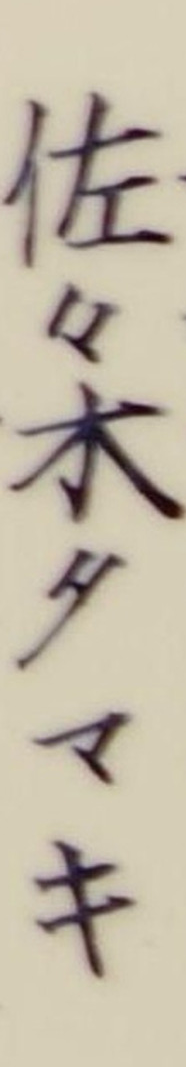佐々木タマキ
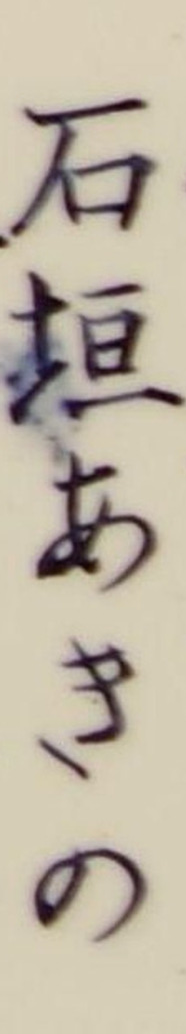石垣あきの
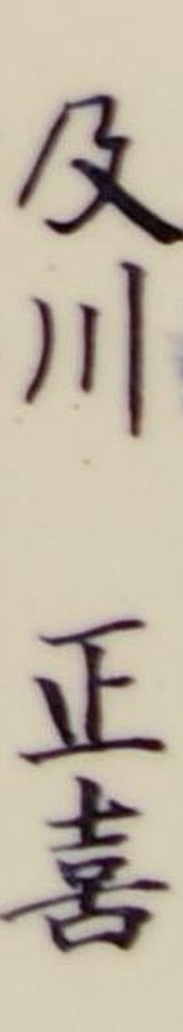及川正喜
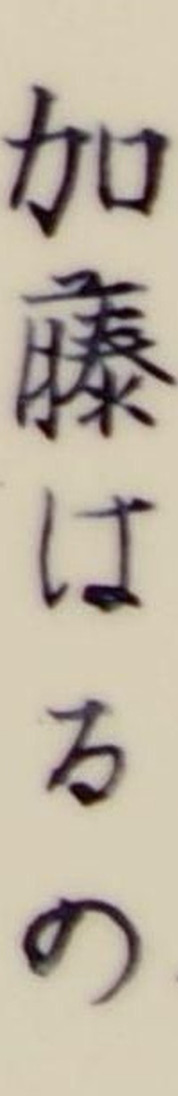加藤はるの
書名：A~D
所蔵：koyasan kongobuji
